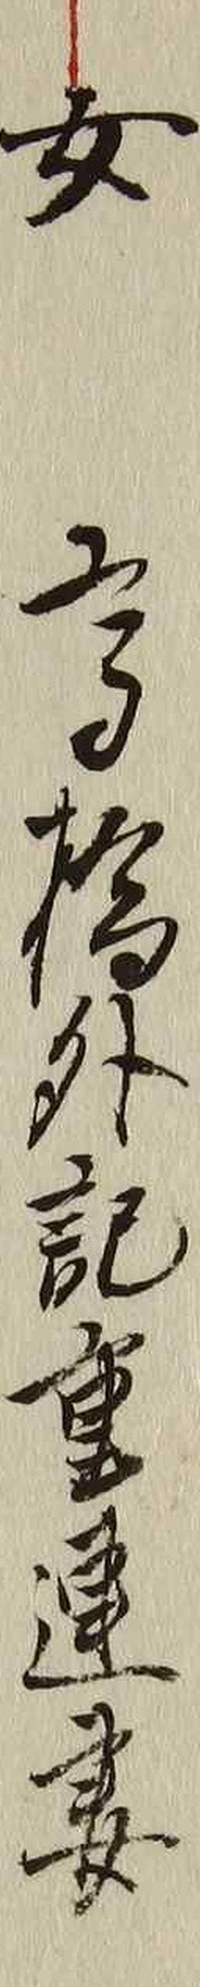女高橋外記重連妻
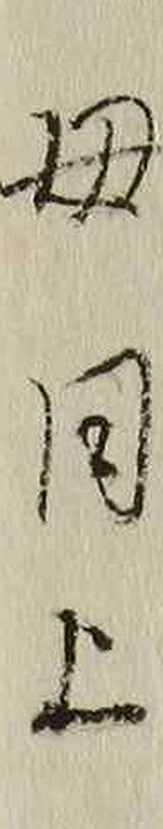母同上
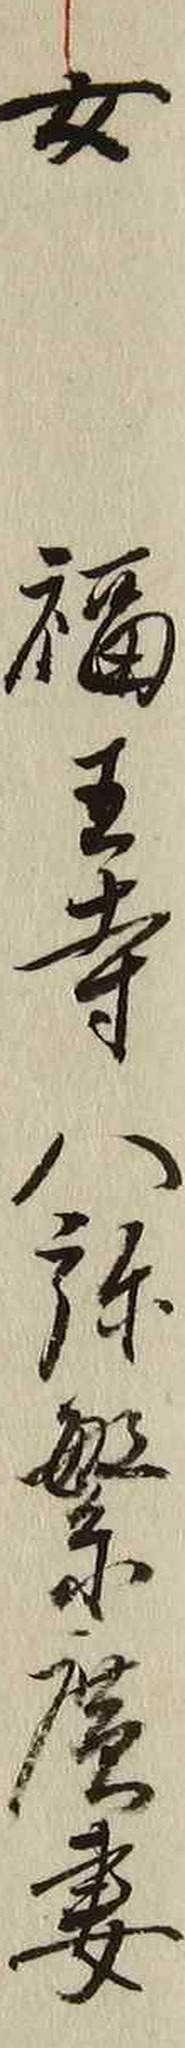女福王寺八弥繁広妻
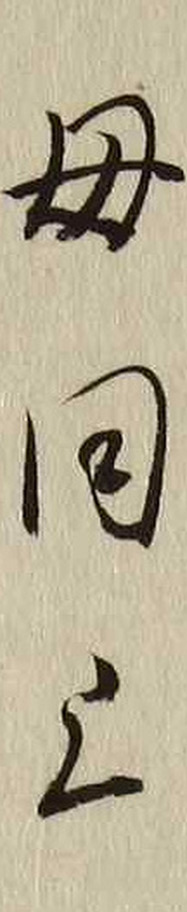母同上
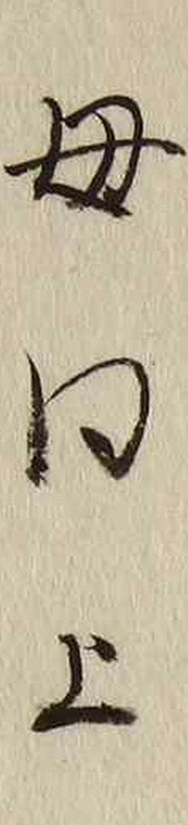母同上
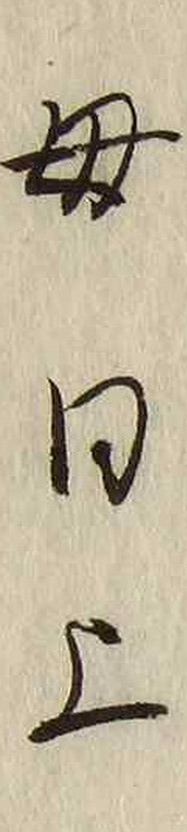母同上

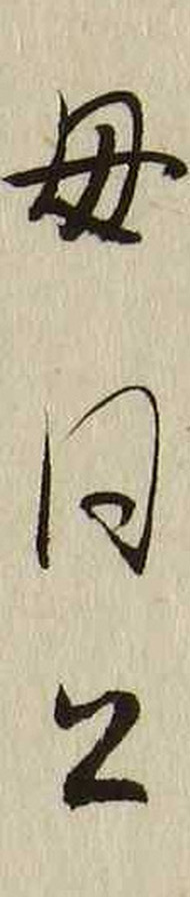母同上
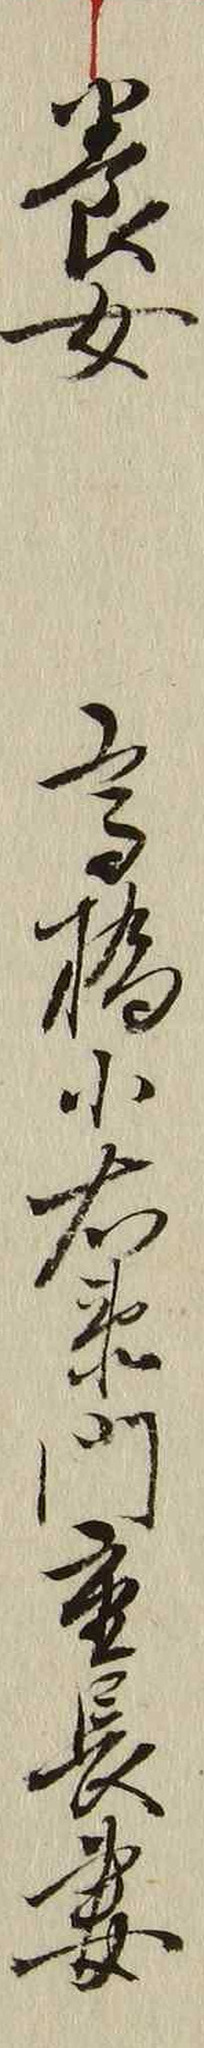養女高橋小右衛門重長妻
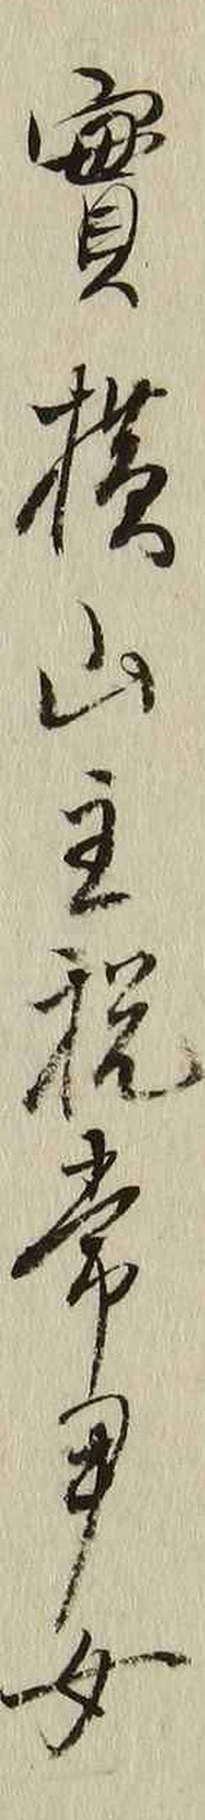実横山主税常尹女
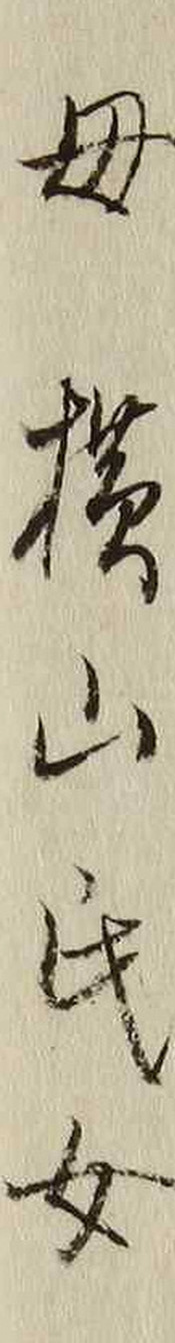母横山氏女
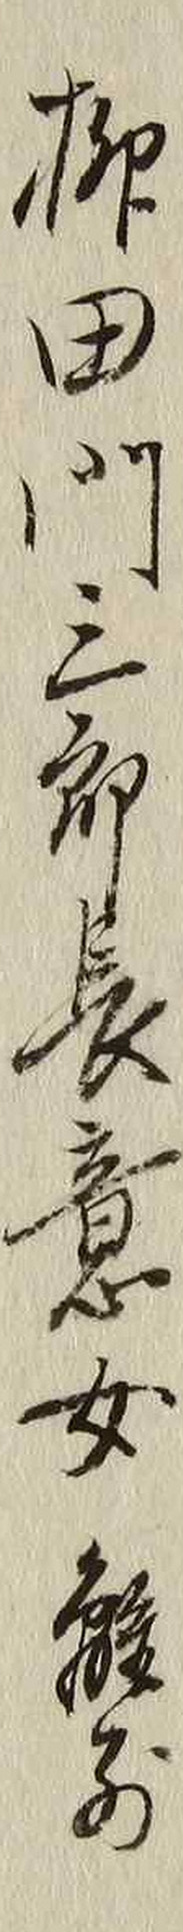柳田門三郎長意女離別
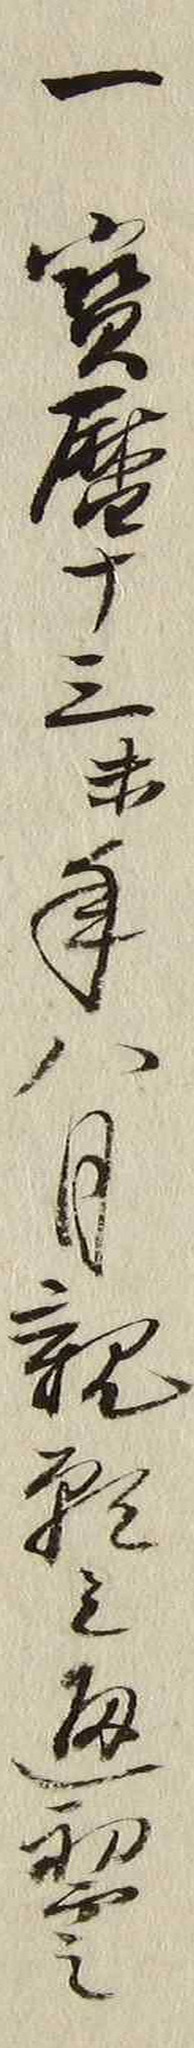一宝暦十三未年八月親願之通初而之
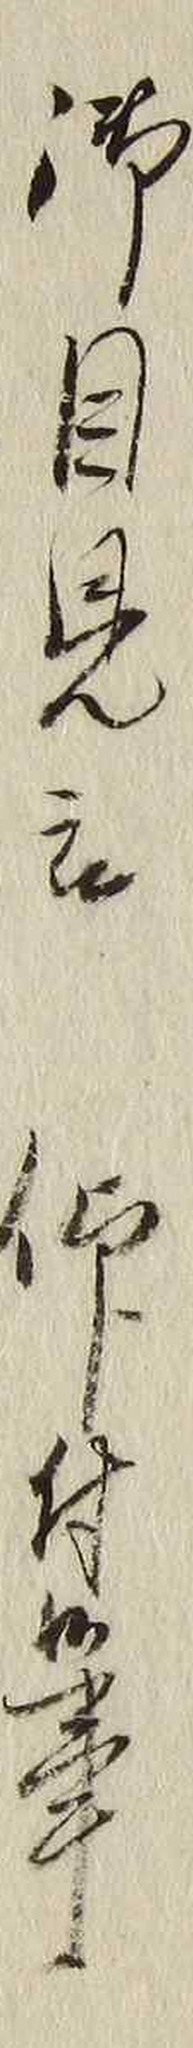御目見被仰付候事
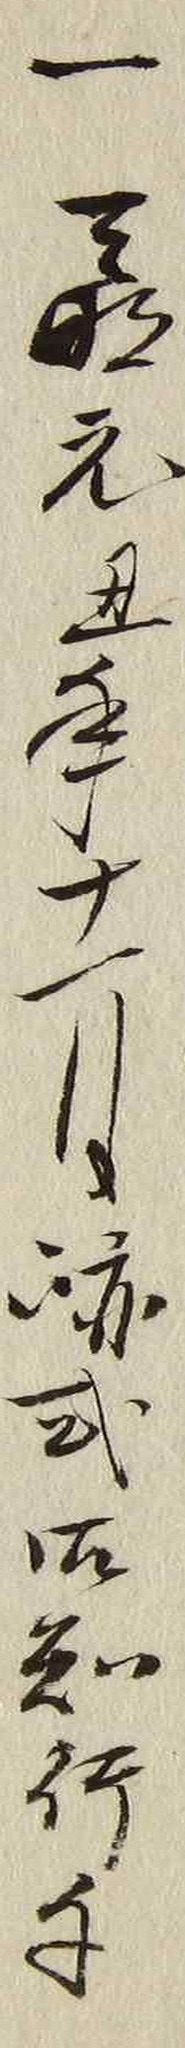一天明元丑年十一月跡式御所知行千
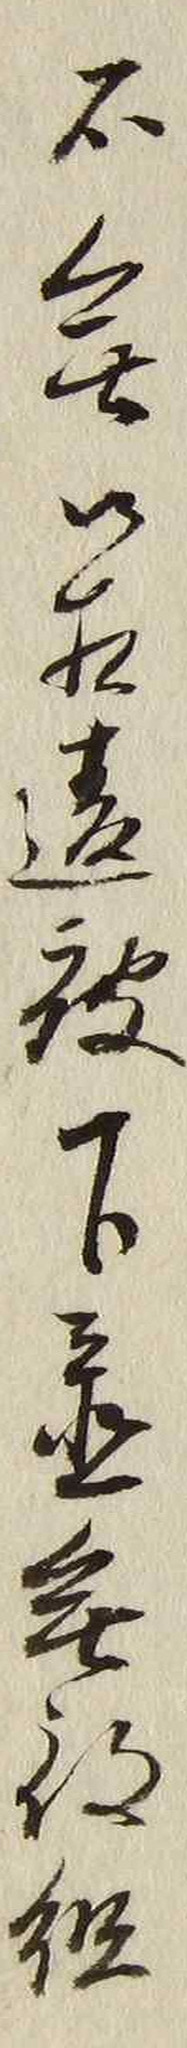石無御相違被下置無役組
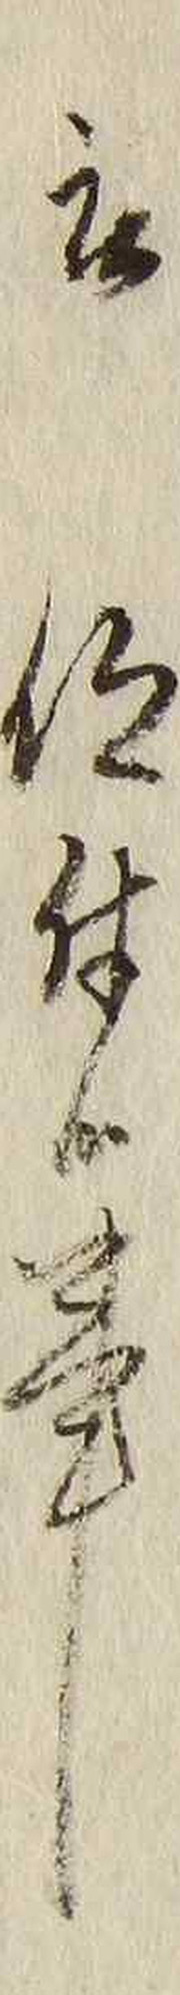被仰付候事
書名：諸士系譜　巻之351　す之部1
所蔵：会津若松市立会津図書館
